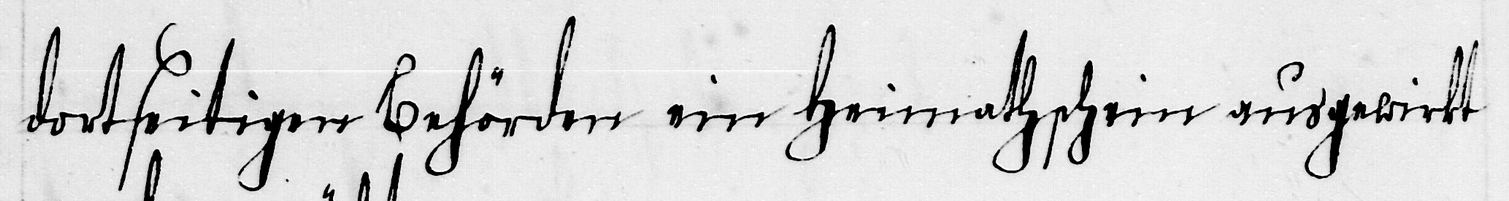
dortseitigen Behörden ein Heimathschein ausgewirkt
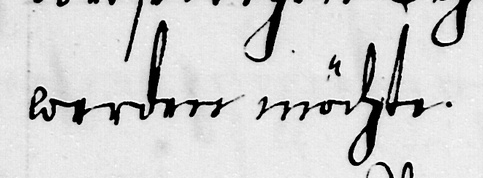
werden möchte.
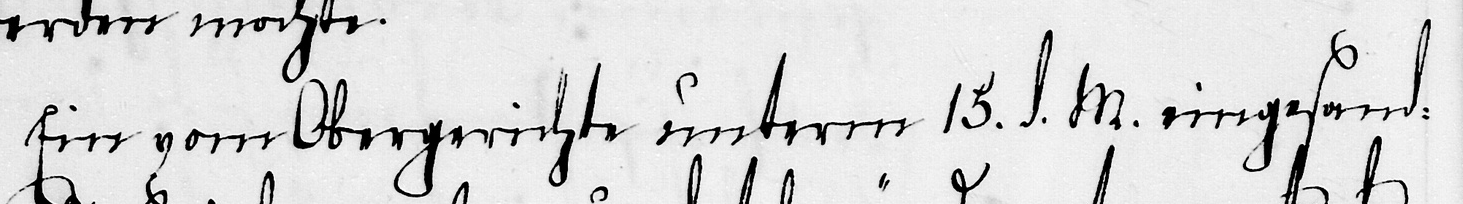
Ein vom Obergerichte unterm 15. d. M. eingesand¬
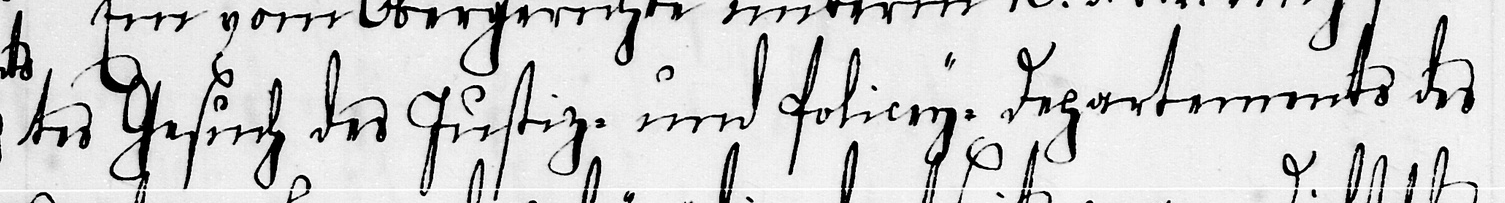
tes Gesuch des Justiz- und Policey-Departements des
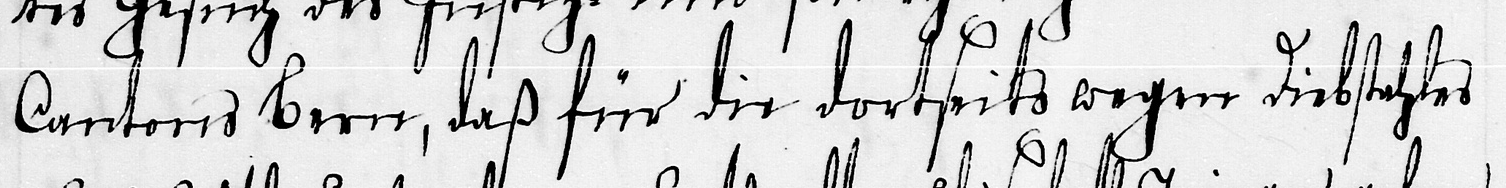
Cantons Bern, daß für die dortseits wegen Diebstahles
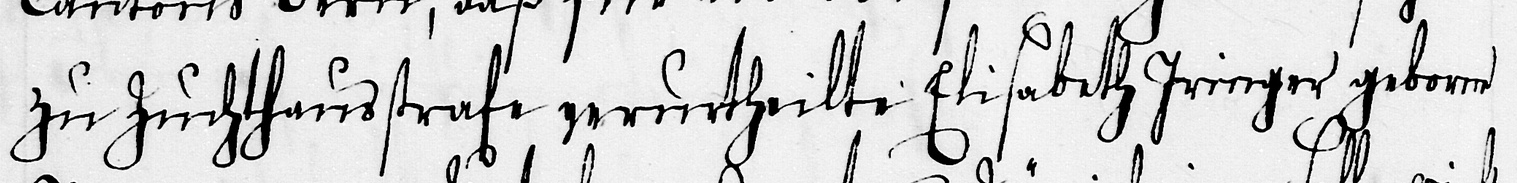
zu Zuchthausstrafe verurtheilte Elisabeth Iringer geborne
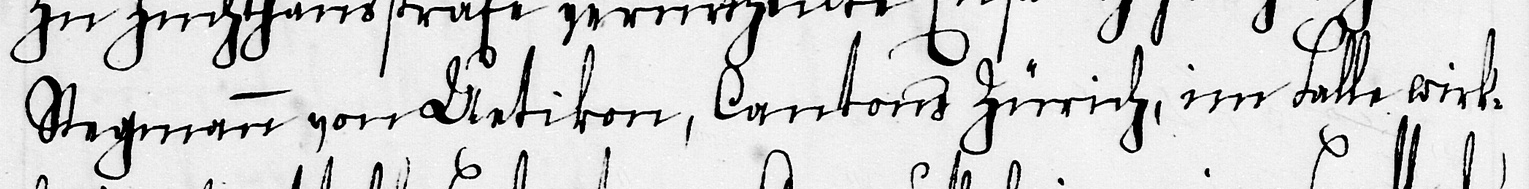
Stegmann von Uetikon, Cantons Zürich, im Falle wirk¬
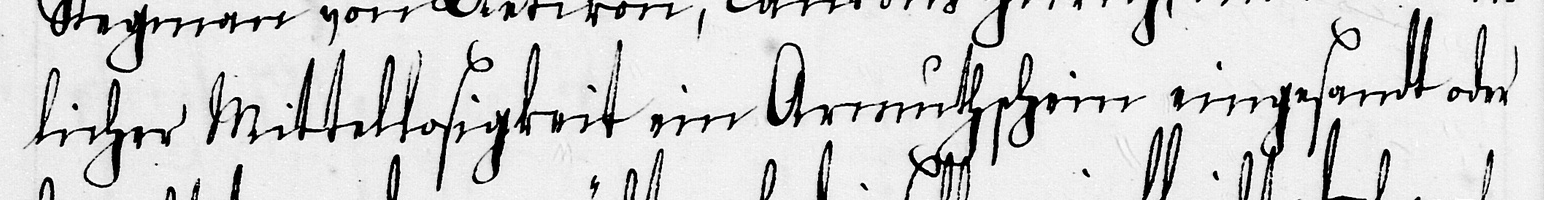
licher Mittellosigkeit ein Armuthschein eingesandt oder
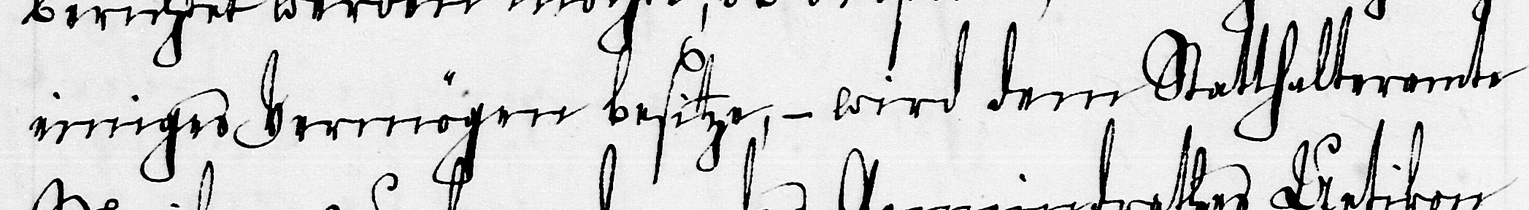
einiges Vermögen besitze, – wird dem Statthalteramte
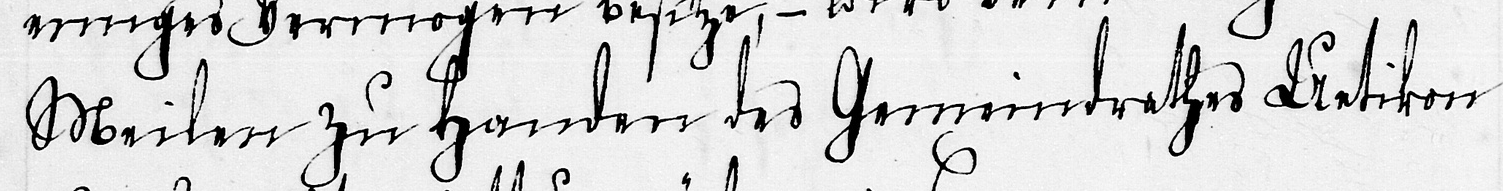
Meilen zu Handen des Gemeindrathes Uetikon
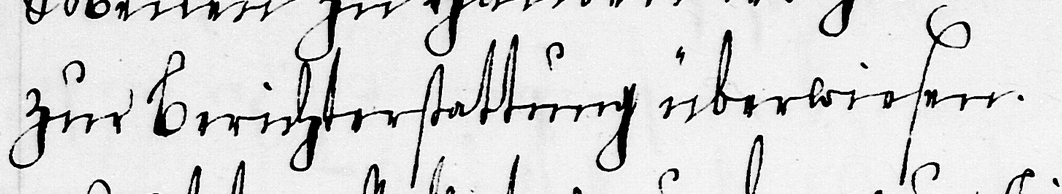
zur Berichterstattung überwiesen.
